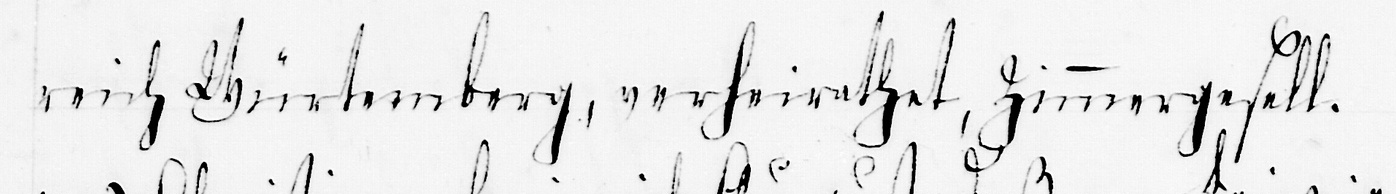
reich Würtemberg, verheirathet, Zimmergesell.
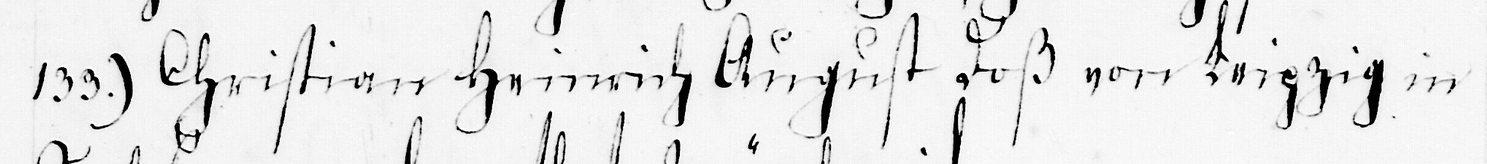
133.) Christian Heinrich August Doß von Leipzig in
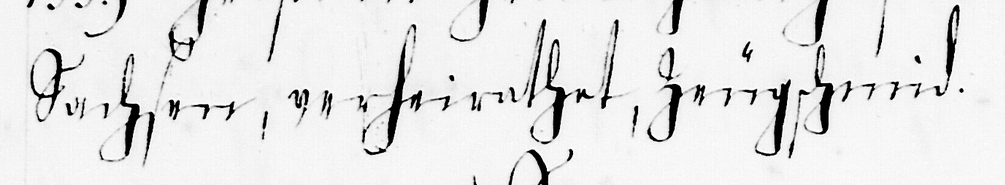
Sachsen, verheirathet, Zeugschmid.
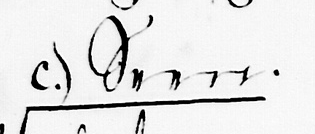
c.) Seen.
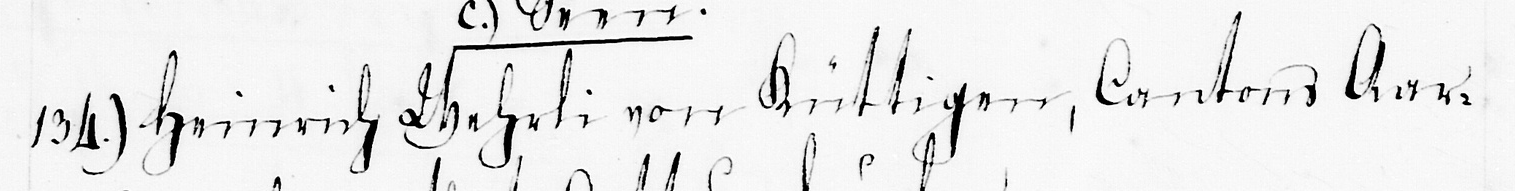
134.) Heinrich Wehrli von Küttigen, Cantons Aar¬
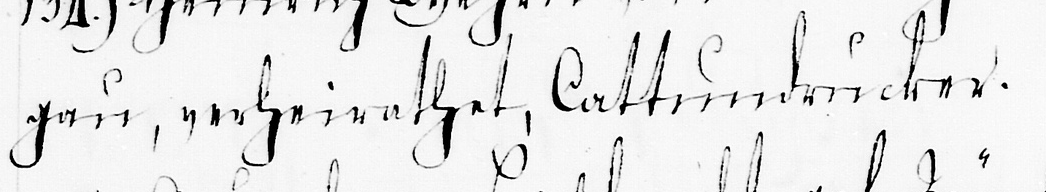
gau, verheirathet, Cattundrucker.
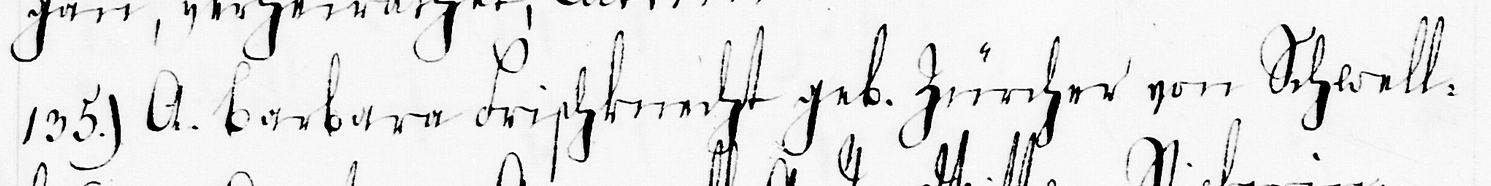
135.) A. Barbara Frischknecht geb. Zürcher von Schwell¬
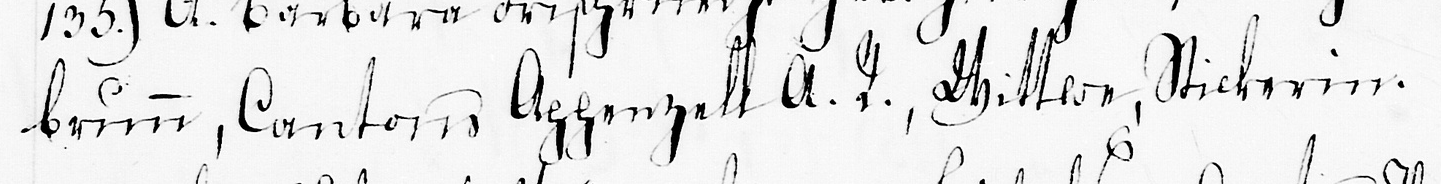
brunn, Cantons Appenzell A. R., Wittwe, Stickerin.
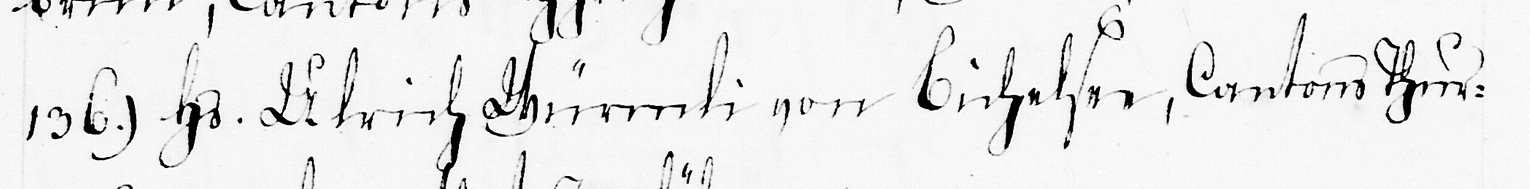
136.) Hs. Ulrich Würmli von Bichelsee, Cantons Thur¬
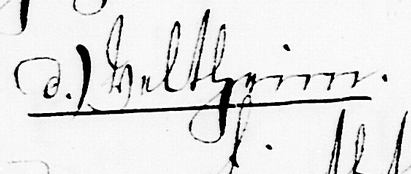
d.) Veltheim.
